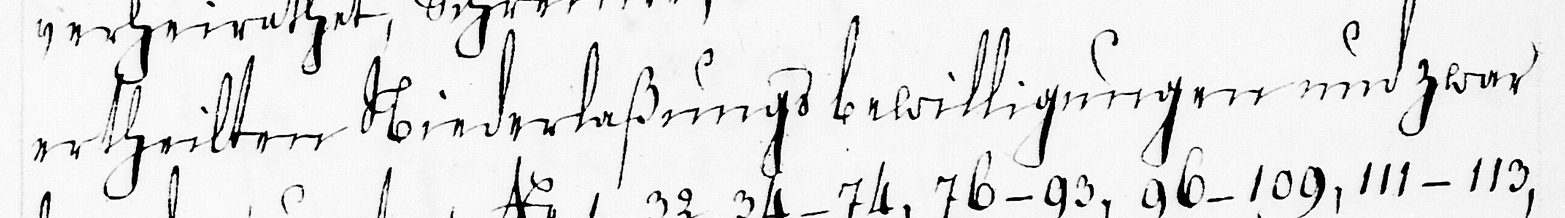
ertheilten Niederlaßungsbewilligungen und zwar
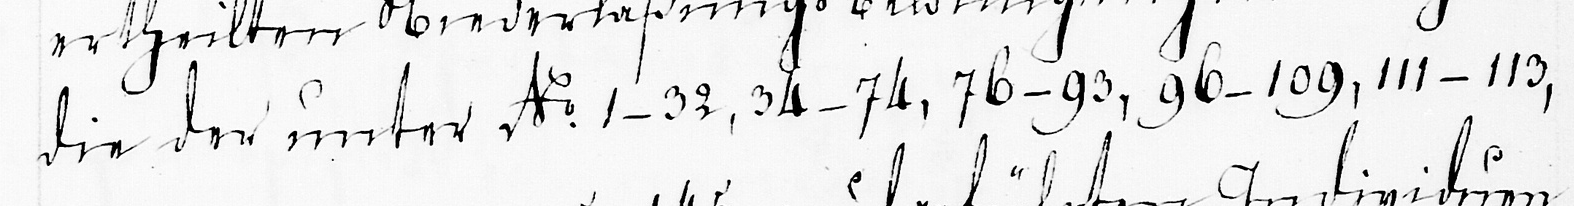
die der unter N°. 1–32, 34–74, 76–93, 96–109, 111–113,
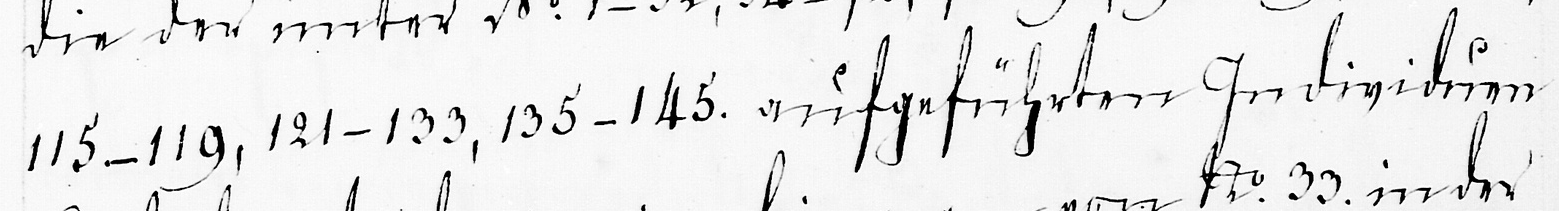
115–119, 121–133, 135–145. aufgeführten Individuen
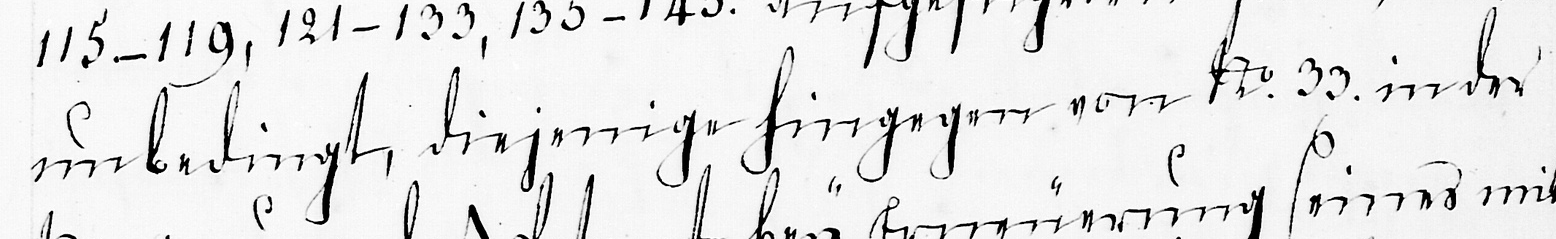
unbedingt, diejenige hingegen von N°. 33. in der
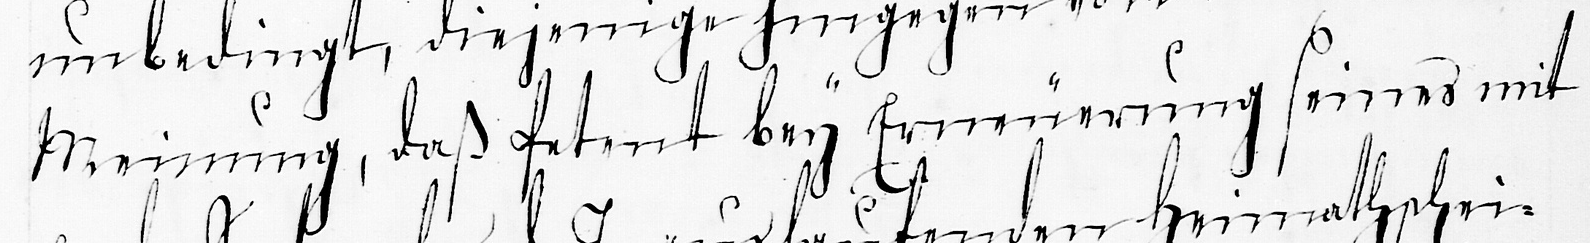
Meinung, daß Petent bey Erneuerung seines mit
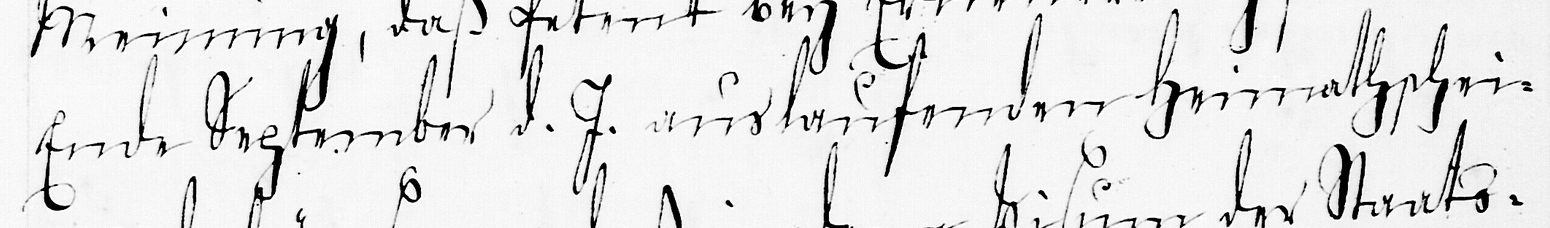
Ende September d. J. auslaufenden Heimathschei¬
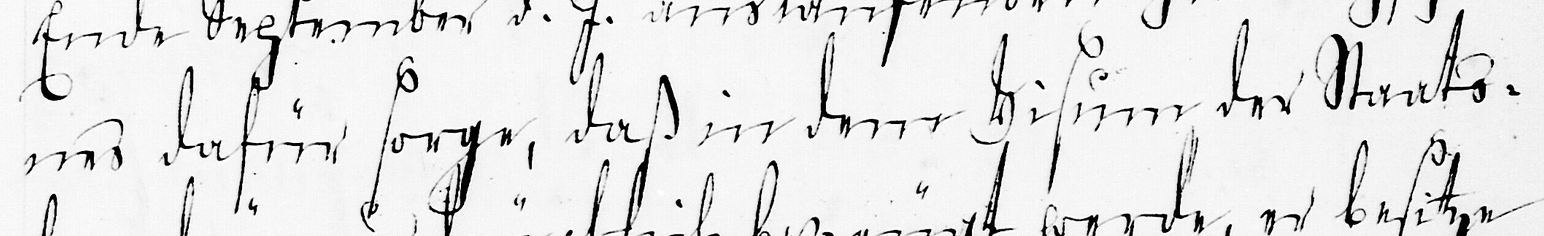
nes dafür sorge, daß in dem Visum der Staats¬
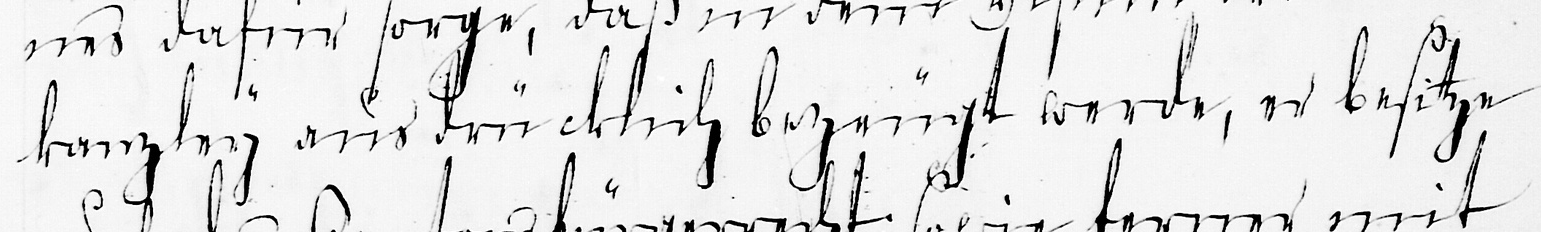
kanzley ausdrücklich bezeugt werde, er besitze
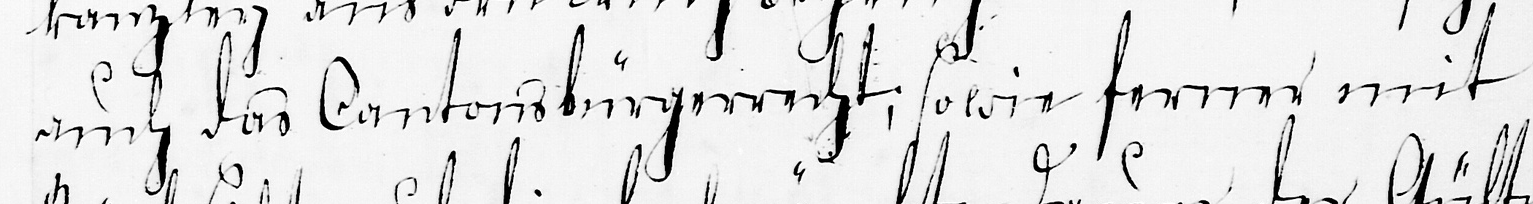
auch das Cantonsbürgerrecht, sowie ferner mit
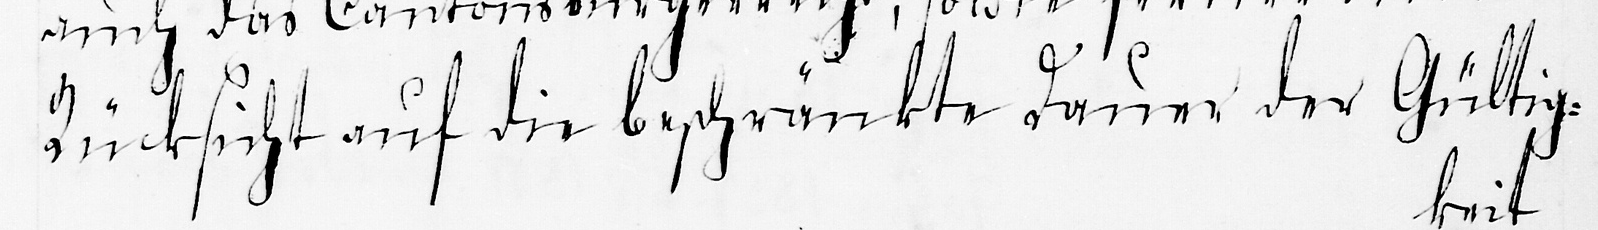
Rücksicht auf die beschränkte Dauer der Gültig-
